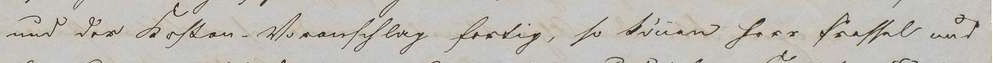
und der KostenVoranschlag fertig, so können Herr Pressel und
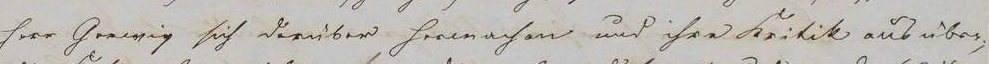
Herr Gerwig sich darüber hermachen und ihre Kritik ausüben;
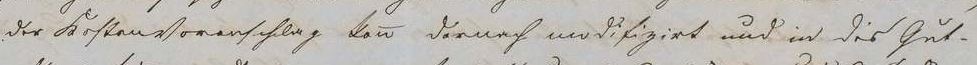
der Kostenvoranschlag kann darnach modifizirt und in das Gut-
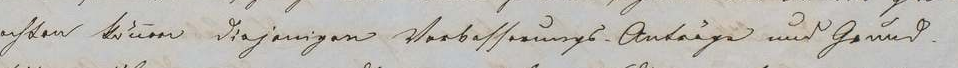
achten können diejenigen Verbesserungs-Anträge und Grund-
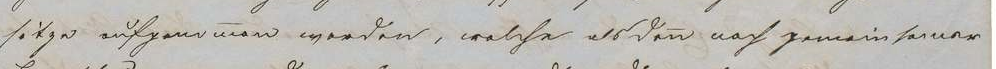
sätze aufgenommen werden, welche alsdann nach gemeinsamer
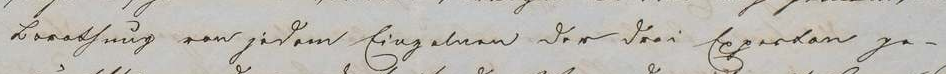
Berathung von jedem Einzelnen der drei Experten ge-
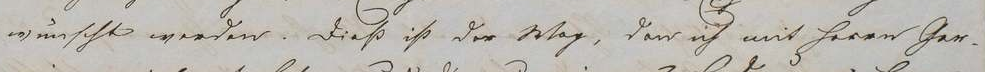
wünscht werden. Dieß ist der Weg, den ich mit Herrn Ger-
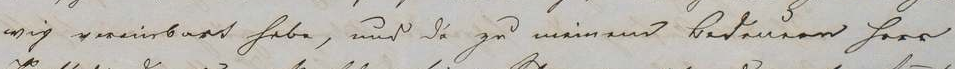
wig vereinbart habe, und da zu meinem Bedauern Herr
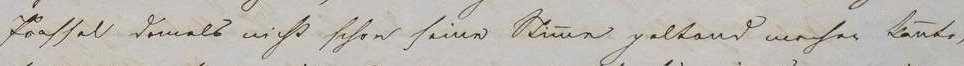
Pressel damals nicht schon seine Stimme geltend machen konnte,
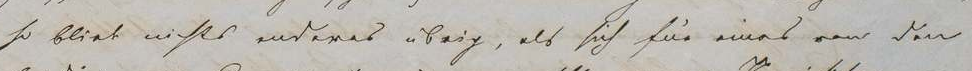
so blieb nichts anderes übrig, als sich für eines von den
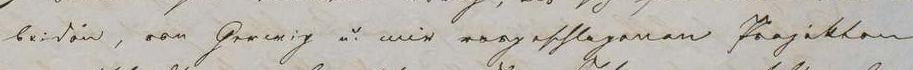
beiden, von Gerwig u. mir vorgeschlagenen Projekten
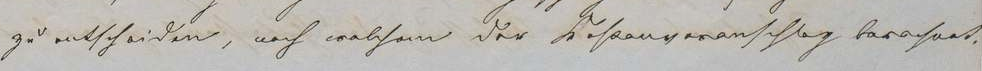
zu entscheiden, nach welchem der Kostenvoranschlag berechnet
